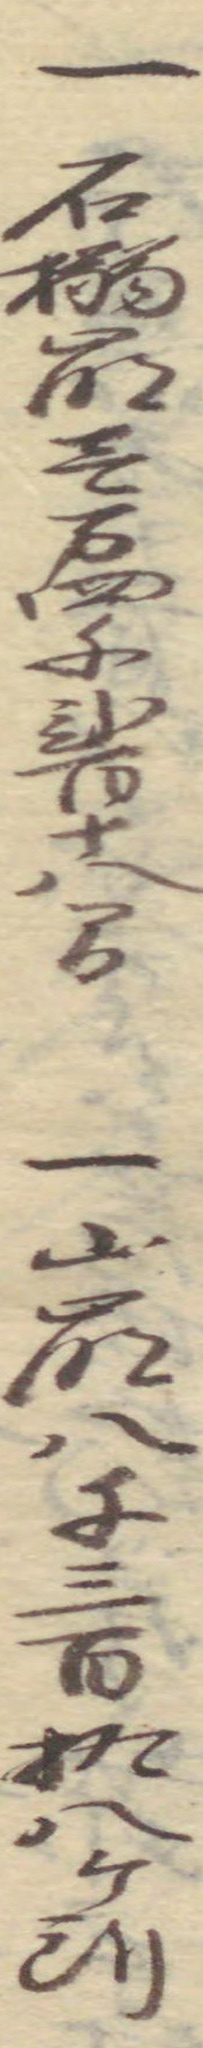一石搦崩壱万四千弐百十八間一山崩八千三百拾八ケ所
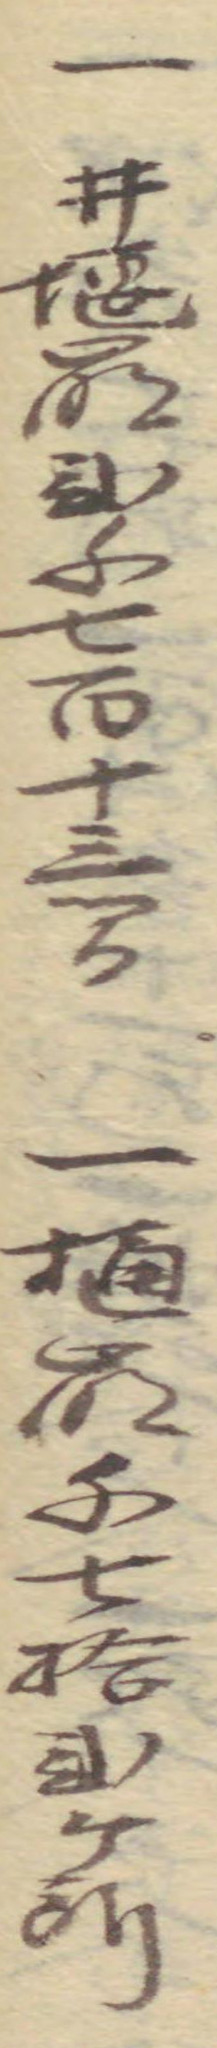一井堰崩弐千七百十三間一樋崩千七拾弐ケ所
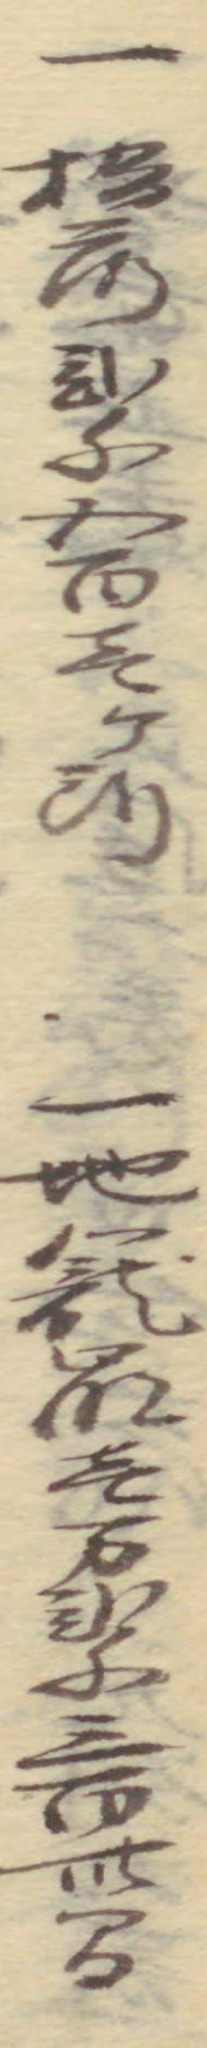一橋落弐千五百壱ケ所一地籠崩壱万弐千三百丗間
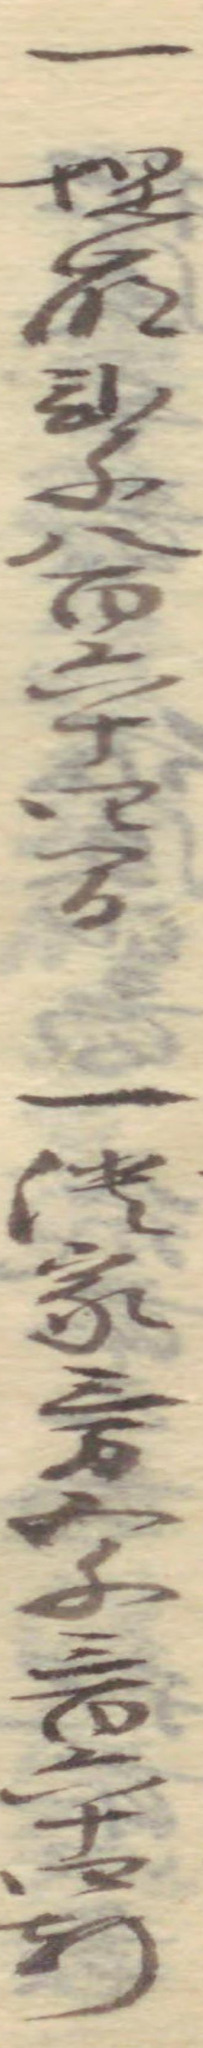一堤崩弐千八百六十四間一潰家三万五千三百六十四軒
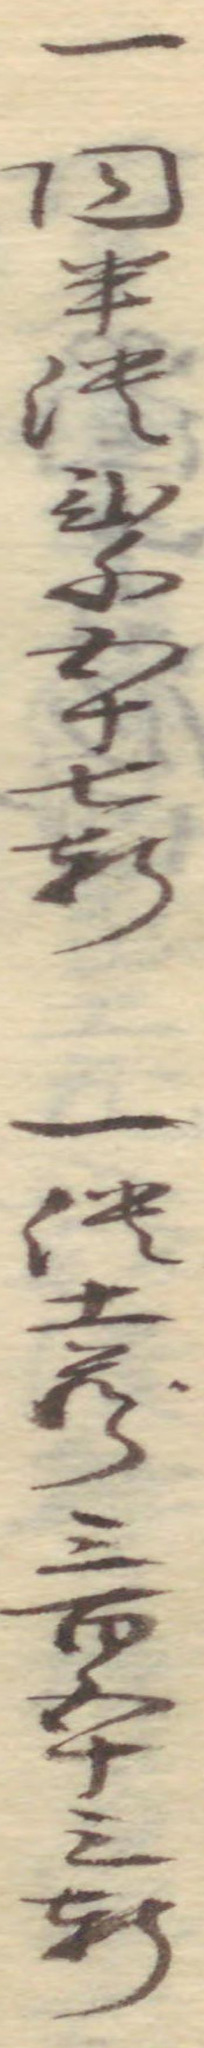一同半潰弐千五十七軒一潰土蔵三百五十三軒
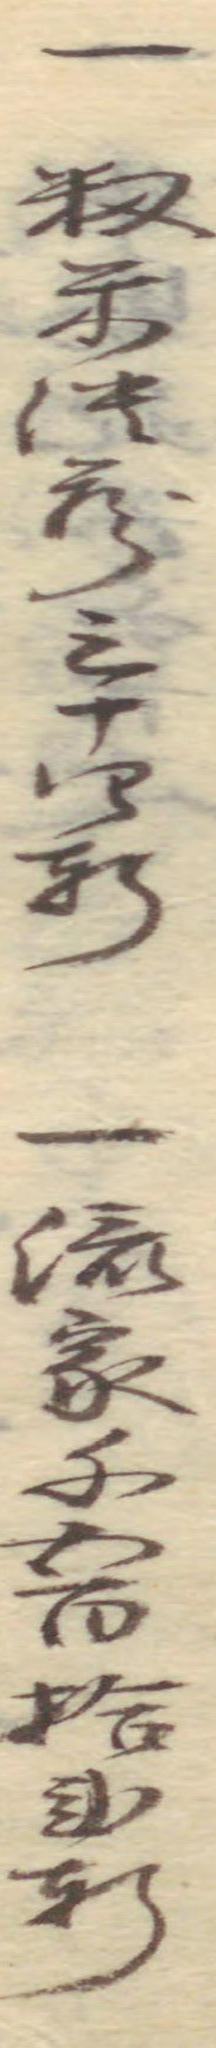一籾米潰蔵三十四軒一流家千五百拾弐軒
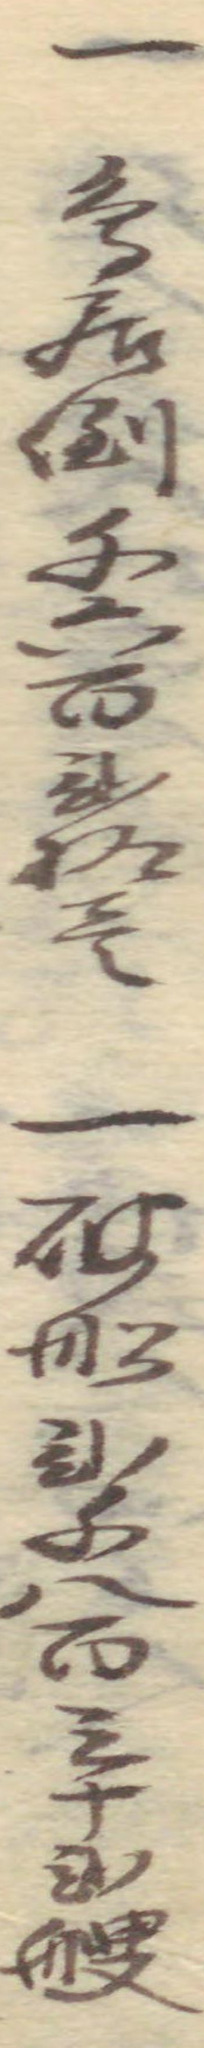一鳥居倒千六百弐拾壱一破船弐千八百三十弐艘
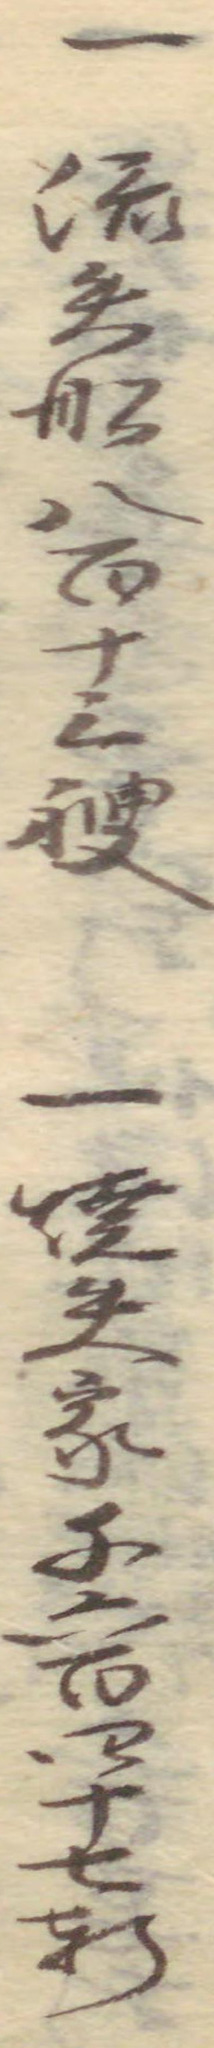一流失船八百十三艘一焼失家千六百四十七軒
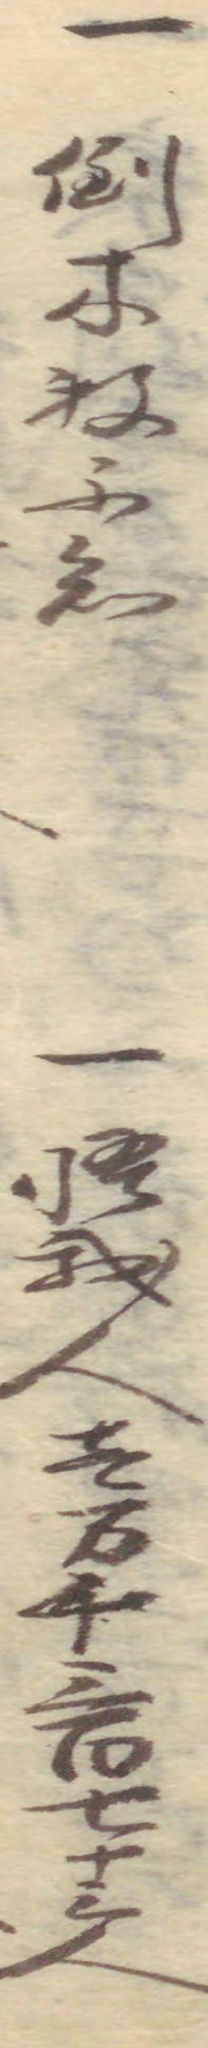一倒木数不知一怪我人壱万千三百七十三人
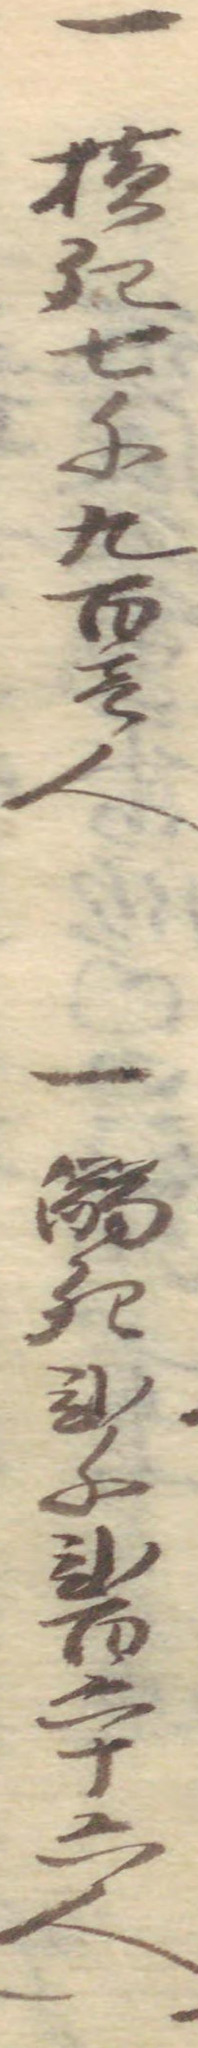一横死七千九百壱人一溺死弐千弐百六十六人
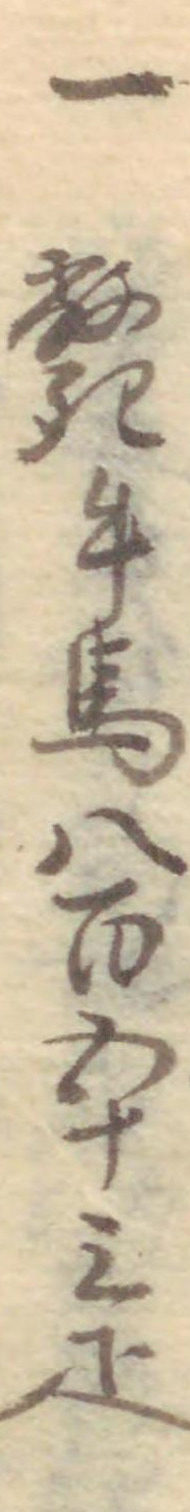一斃牛馬八百五十三疋
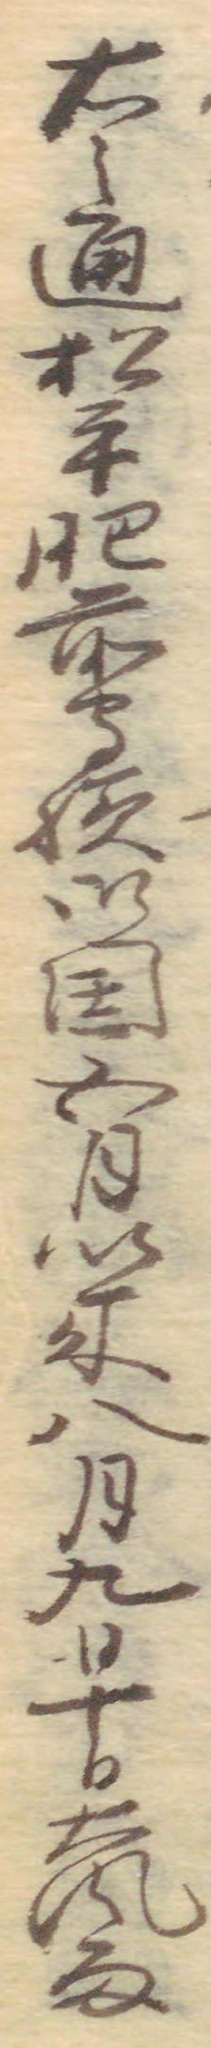右之通松平肥前守様御国五月以来八月九日十日大風雨

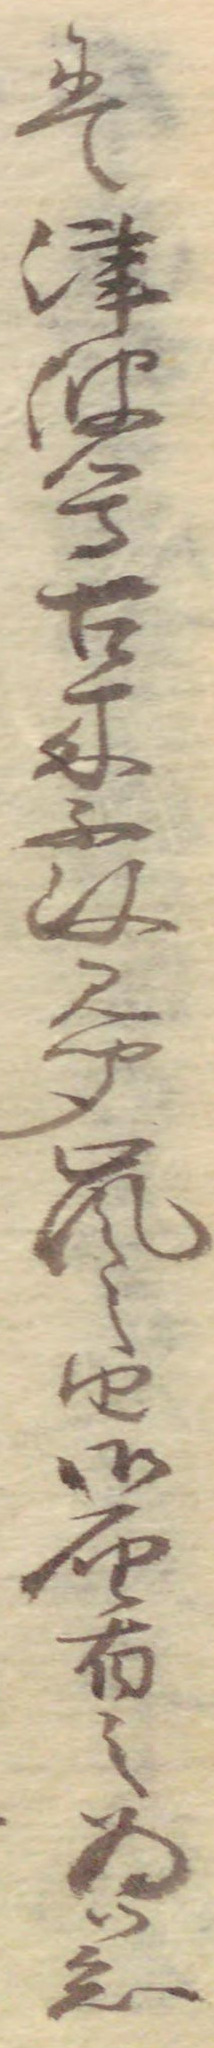にて津波等古来不致見聞嵐之由御届有之為御知
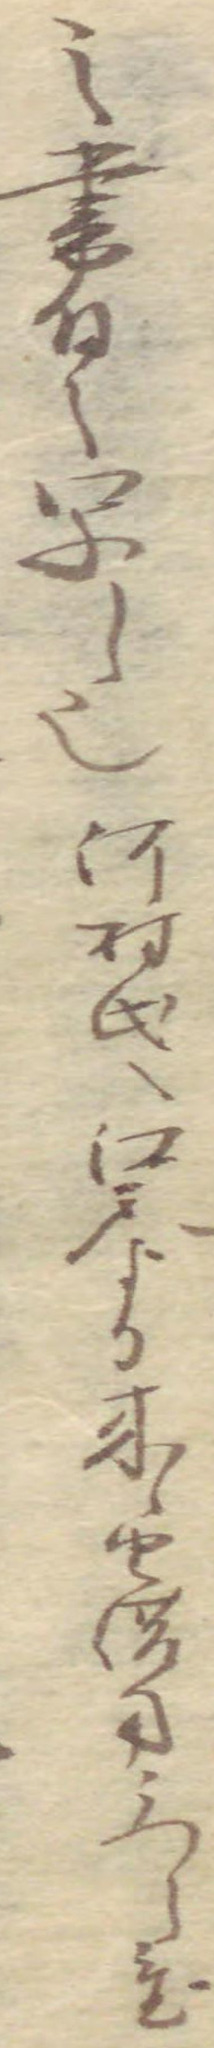之書付之写し也河村氏へ江戸より来候由借用うつし置
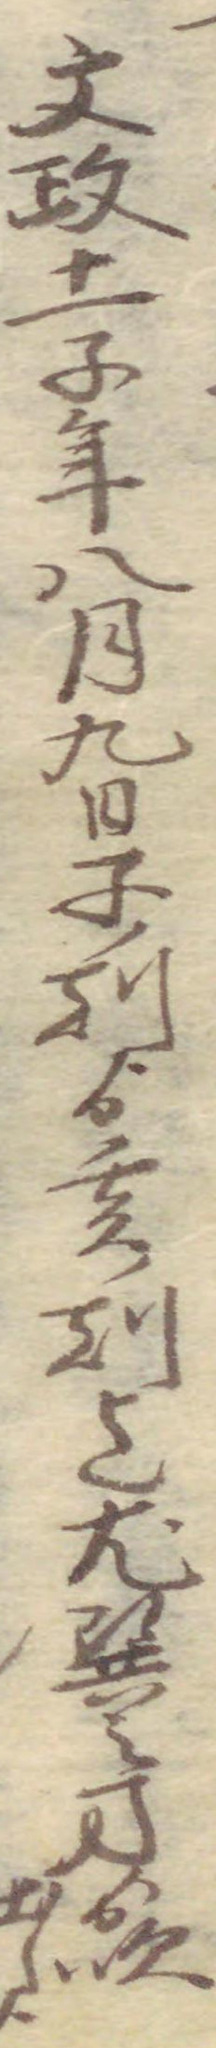文政十一子年八月九日子ノ刻ゟ亥ノ刻迄尤巽之方ゟ吹出し候
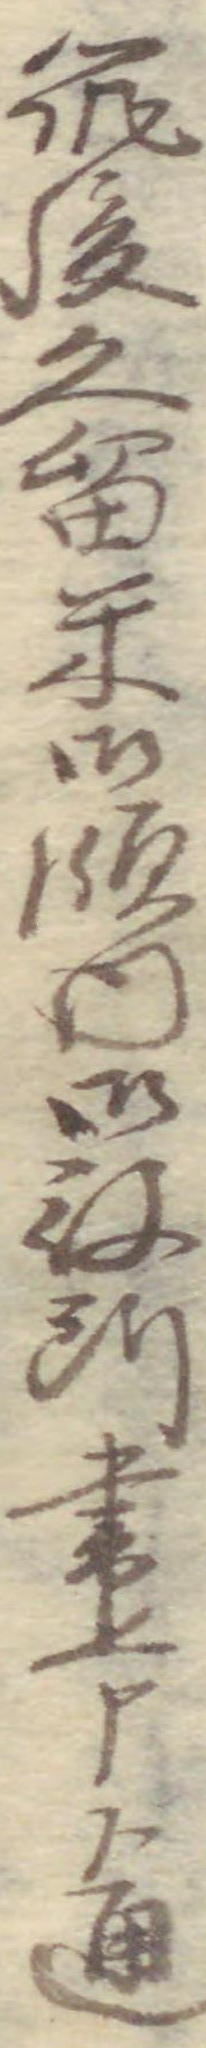筑後久留米御領内御役所書上申候通
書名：鶯宿雑記. 巻199-200
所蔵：国立国会図書館 National Diet Library, JAPAN
